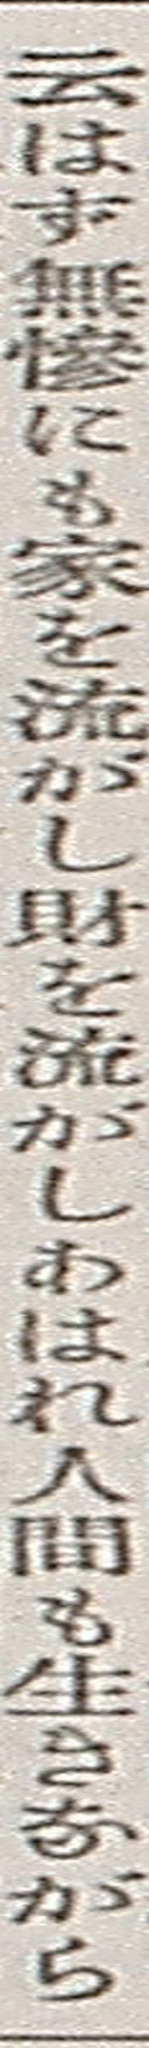云はず無惨にも家を流がし財を流がしあはれ人間も生きながら
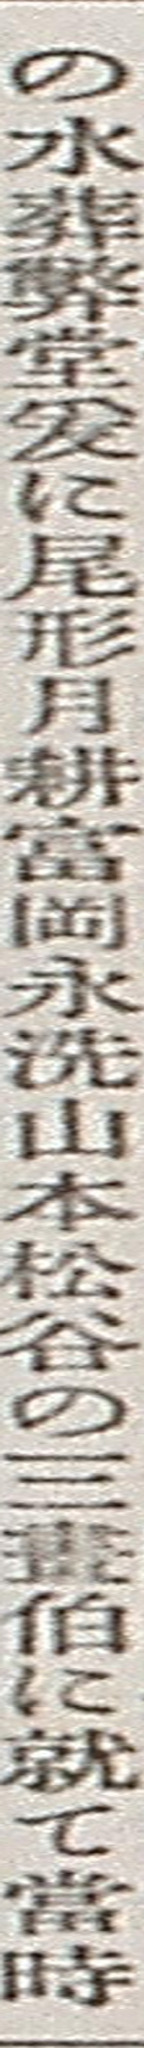の水葬弊堂爰に尾形月耕富岡永洗山本松谷の三画伯に就て当時
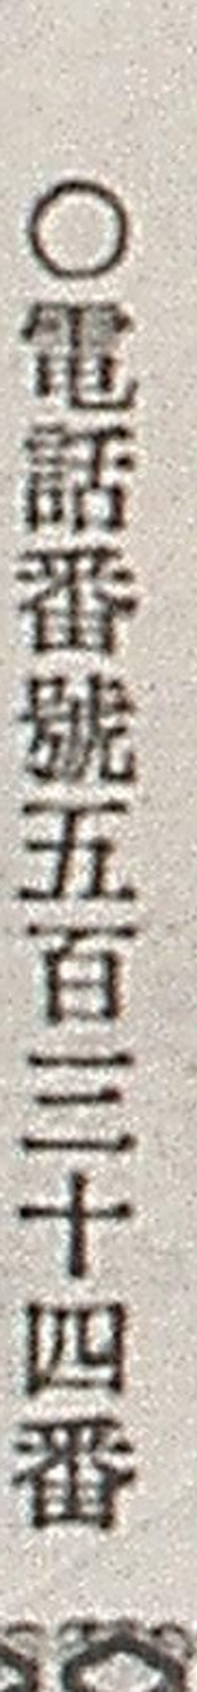〇電話番号五百三十四番
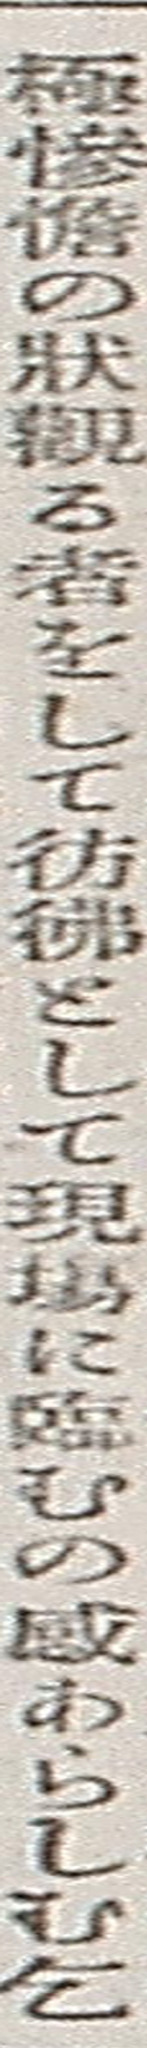極惨憺の状観る者をして彷彿として現場に臨むの感あらしむ乞
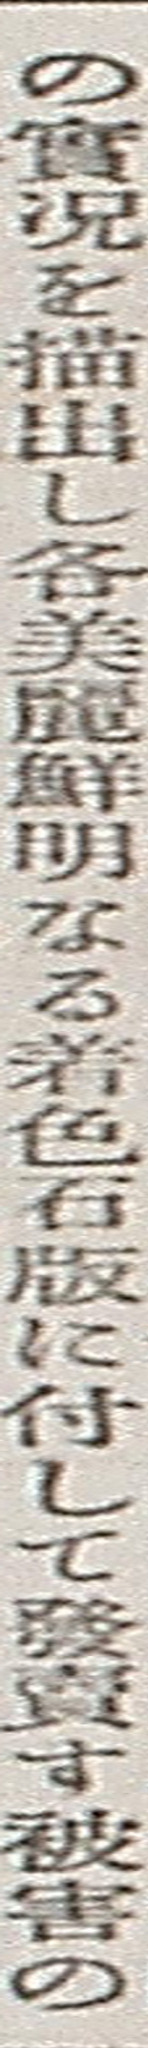の実況を描出し各美麗鮮明なる着色石版に付して発売す被害の
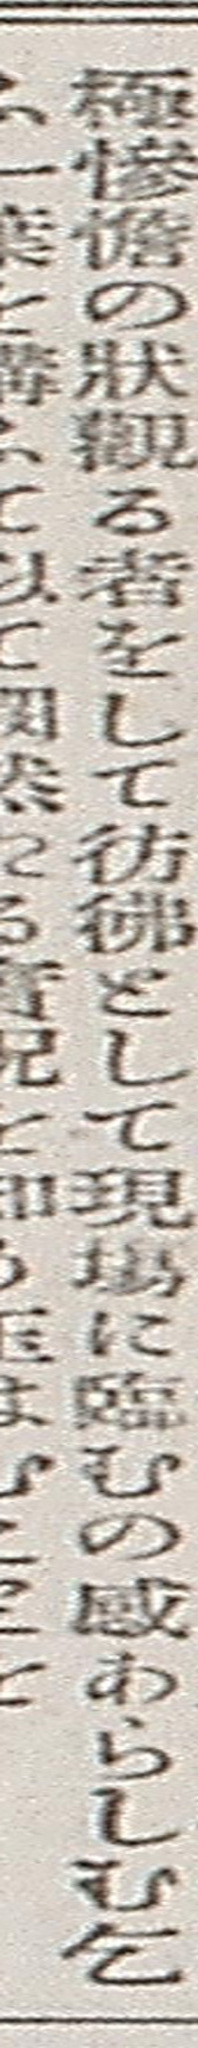極惨憺の状観る者をして彷彿として現場に臨むの感あらしむ乞
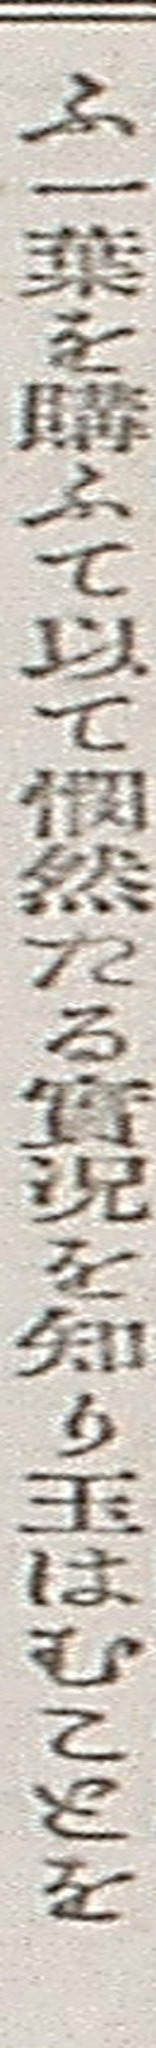ふ一葉を購ふて以て憫然たる実況を知り玉はむことを

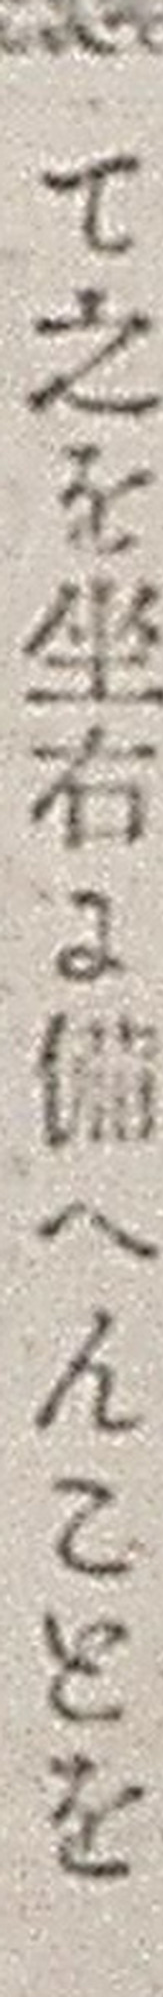て之を坐右に備へんことを
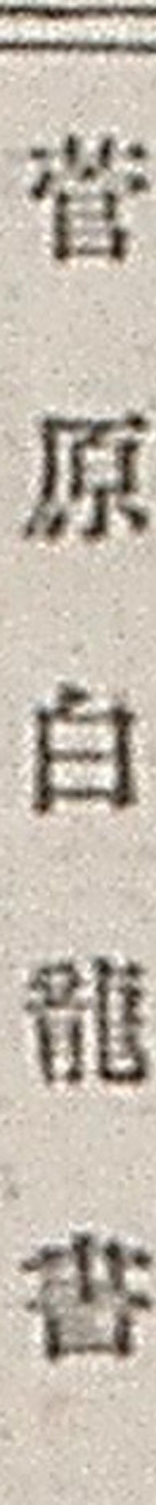菅原白龍書
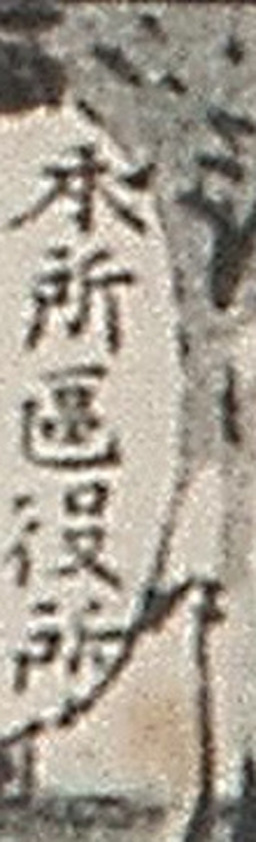本所区役所
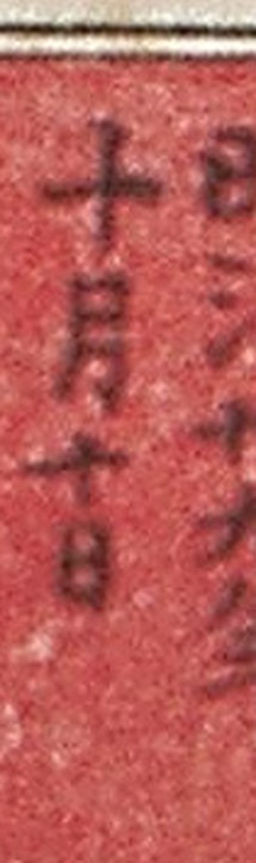十月十日
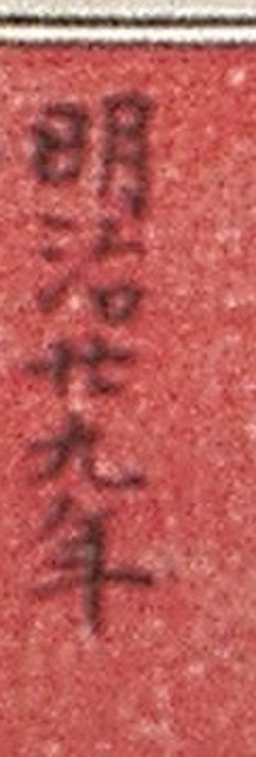明治廿九年
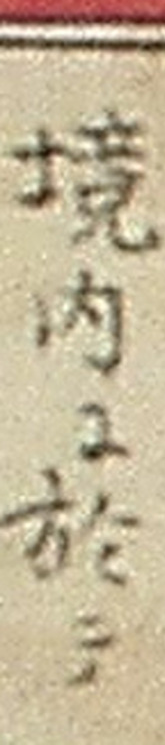境内に於テ
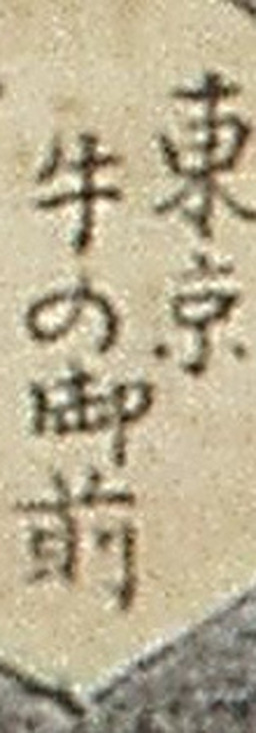牛の御前
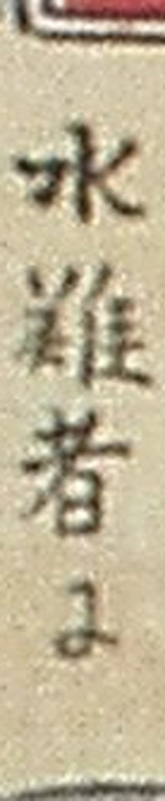水難者に
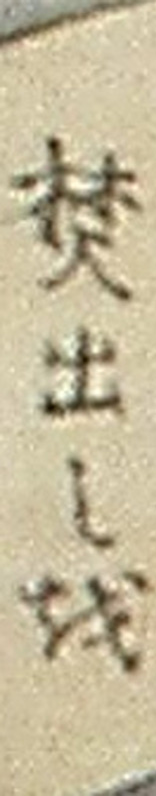焚出しを
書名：風俗畫報臨時増刊第百二十號　大海嘯被害録（下）
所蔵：東京大学地震研究所図書室 Earthquake Research Institute Library, The University of Tokyo, JAPAN
